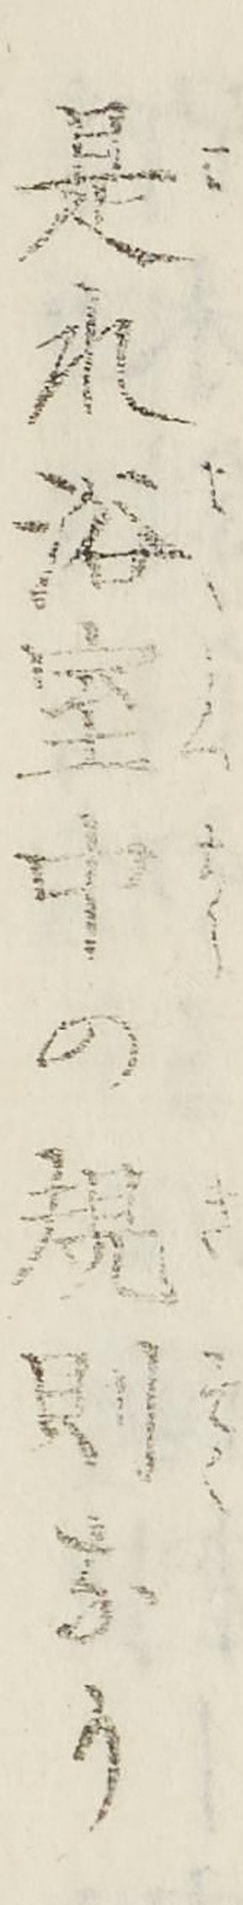是れ浴室中の規則なり

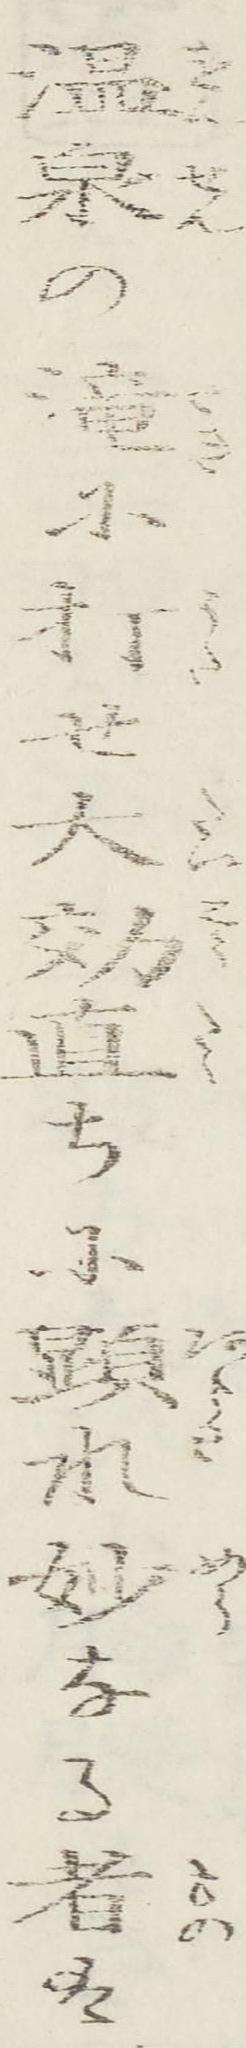温泉の滝に打せ大効直ちに顕れ妙なる者は
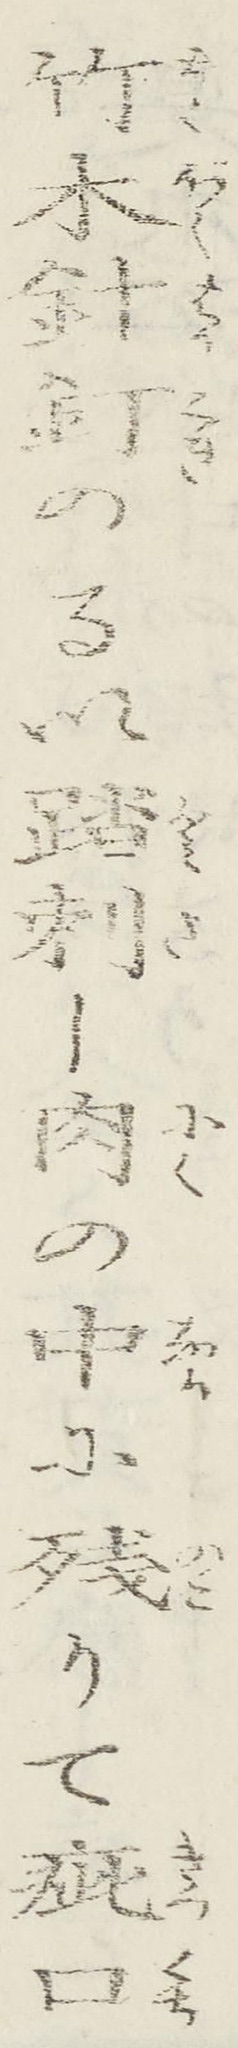竹木針釘のるい踏刺し肉の中に残りて疵口
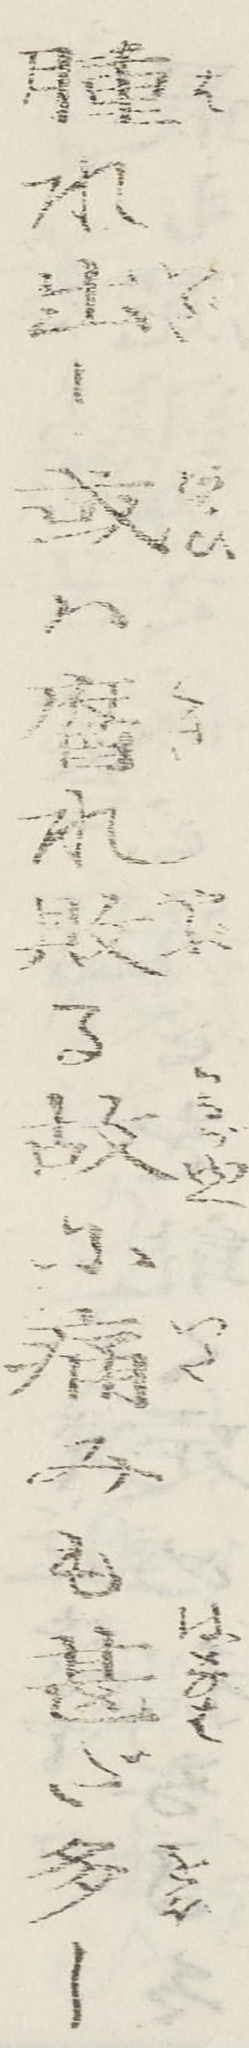腫れ出し或は腐れ敗る故に痛みも甚だ多し
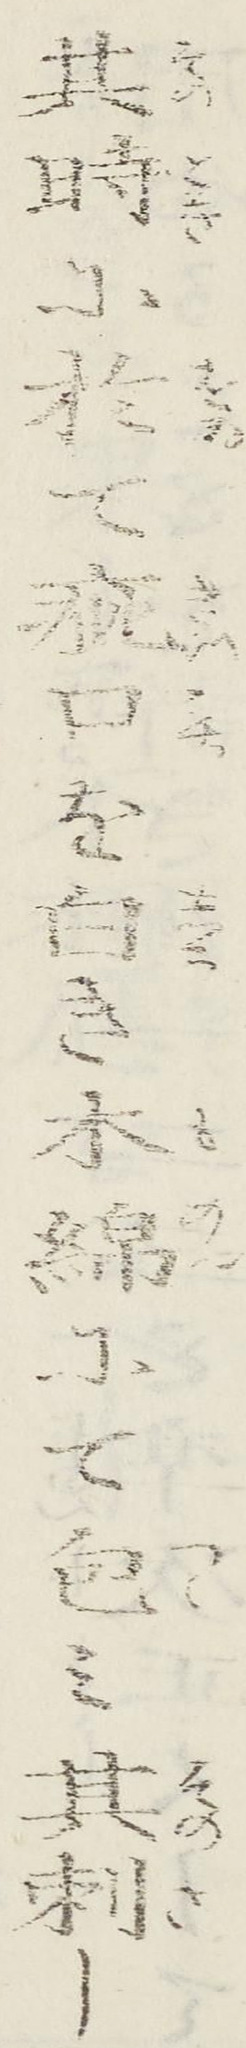其時に於て疵口を白き木綿にて包み其刺し
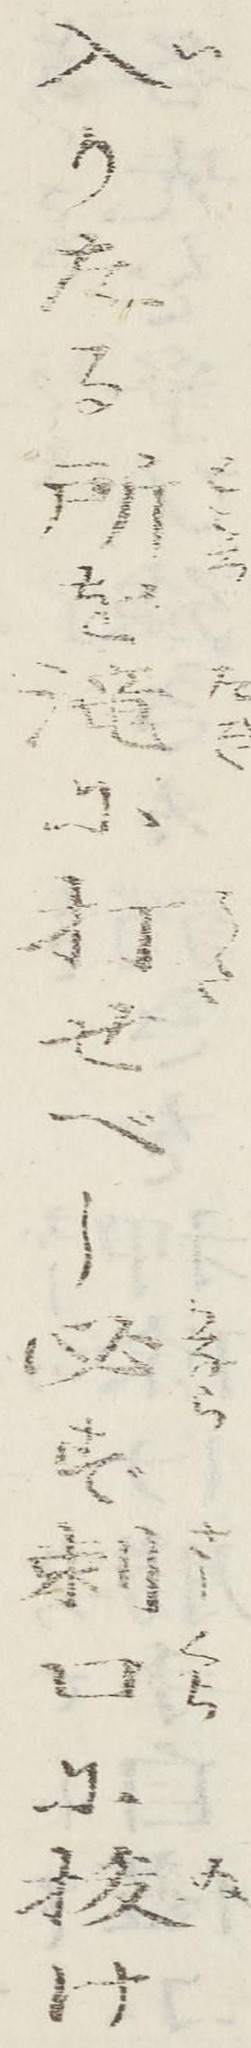入りたる所を滝に打せべし必す刺口に抜け
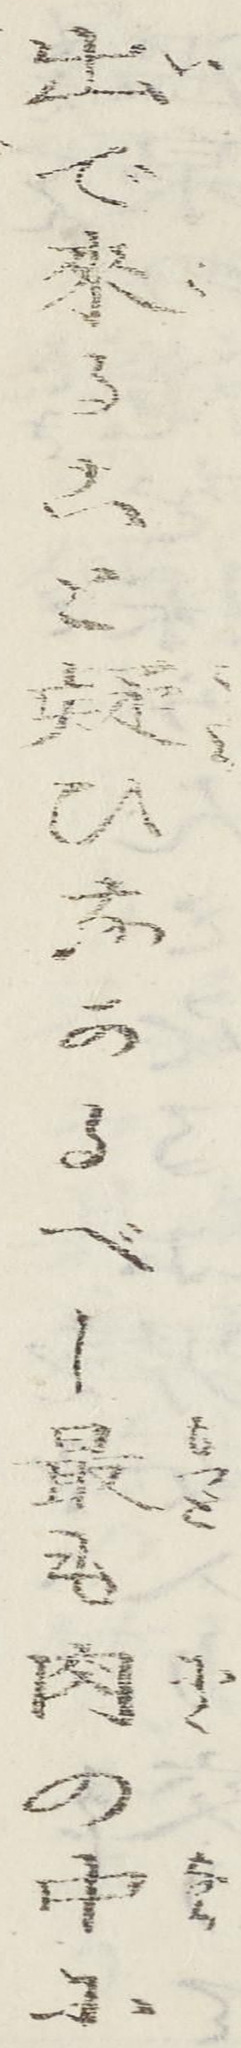出で来ること疑ひなかるべし最も肉の中に
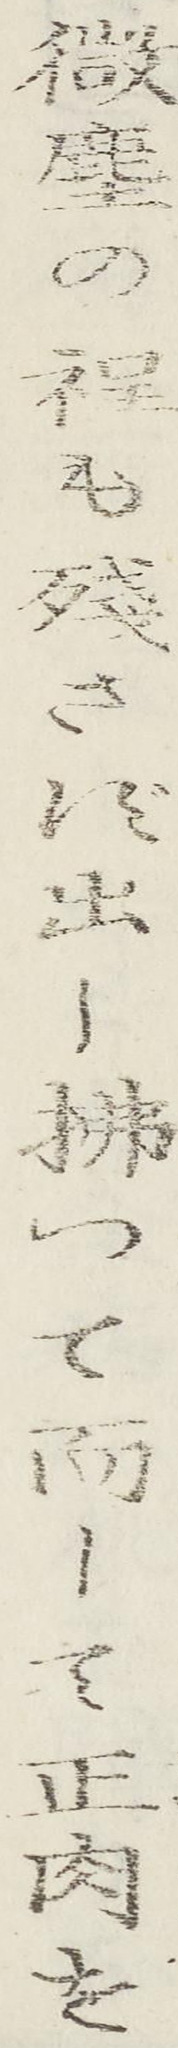微塵の程も残さず出し払つて而して正肉を
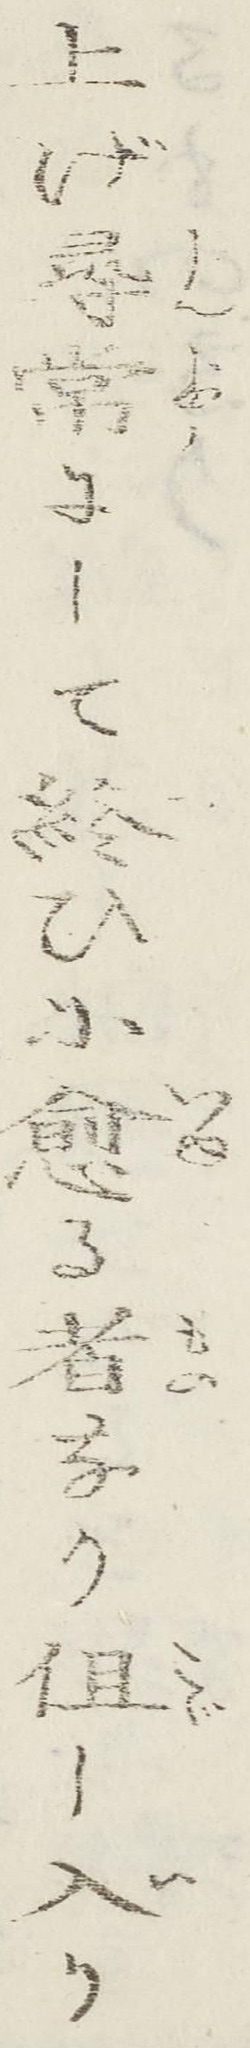上げ尋常にして終ひに愈る者なり但し入り
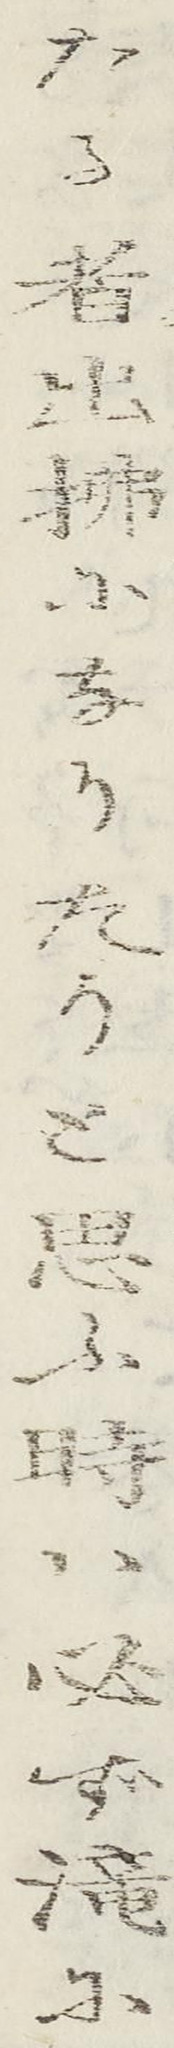たる者出払になりたりと思ふ時は必ず滝に
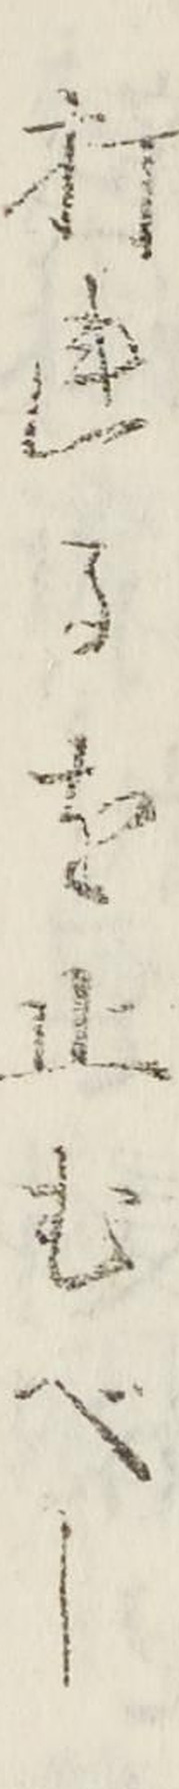打れるを止むべし
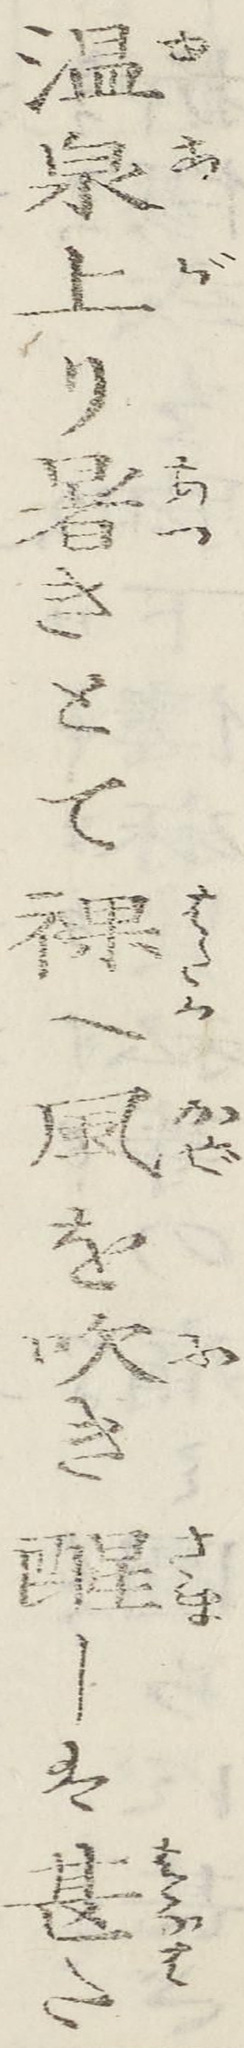温泉上り暑きとて裸へ風を吹き醒しは甚た
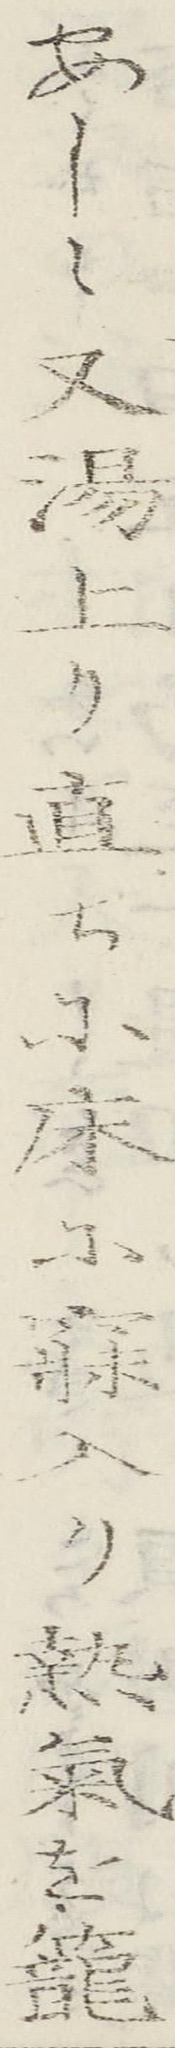あしゝ又湯上り直ちに床に寝入り熱気を籠
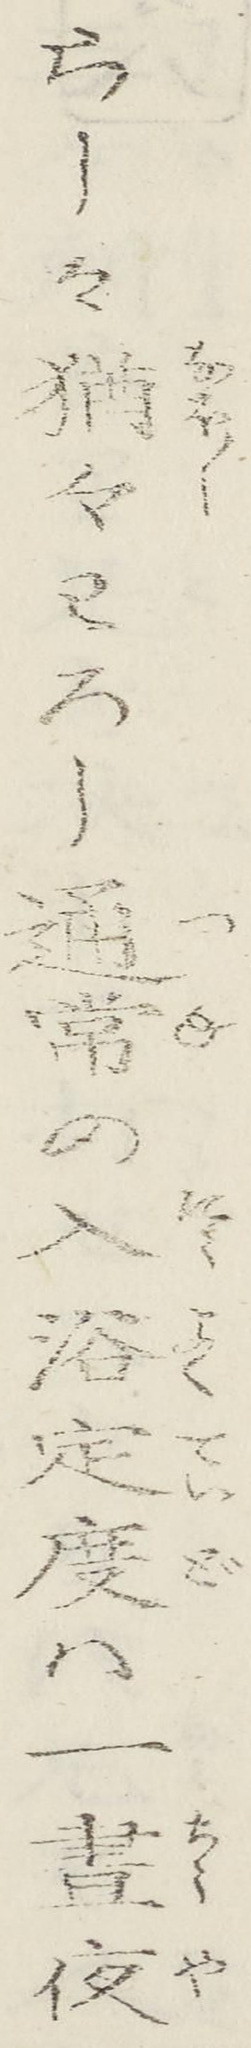らしは猶々わろし通常の入浴定度は一昼夜
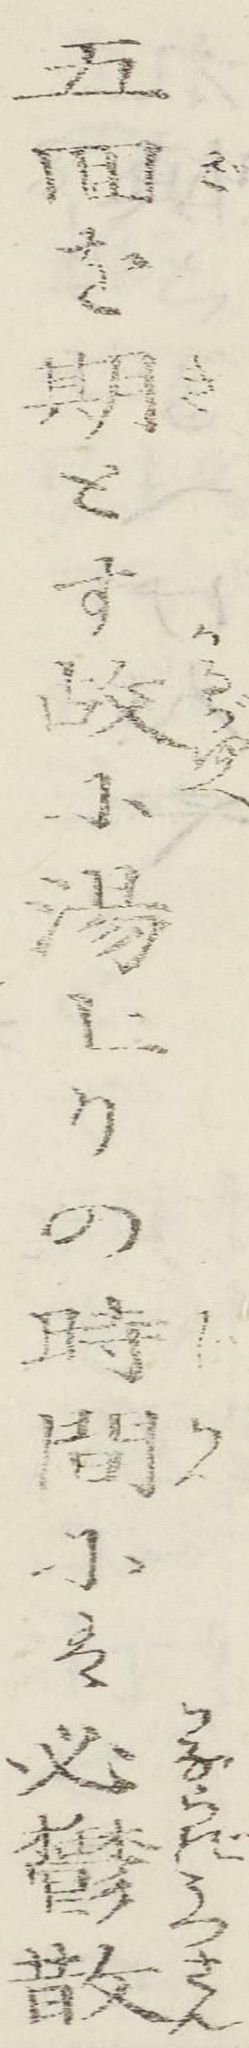五回を期とす故に湯上りの時間には必鬱散
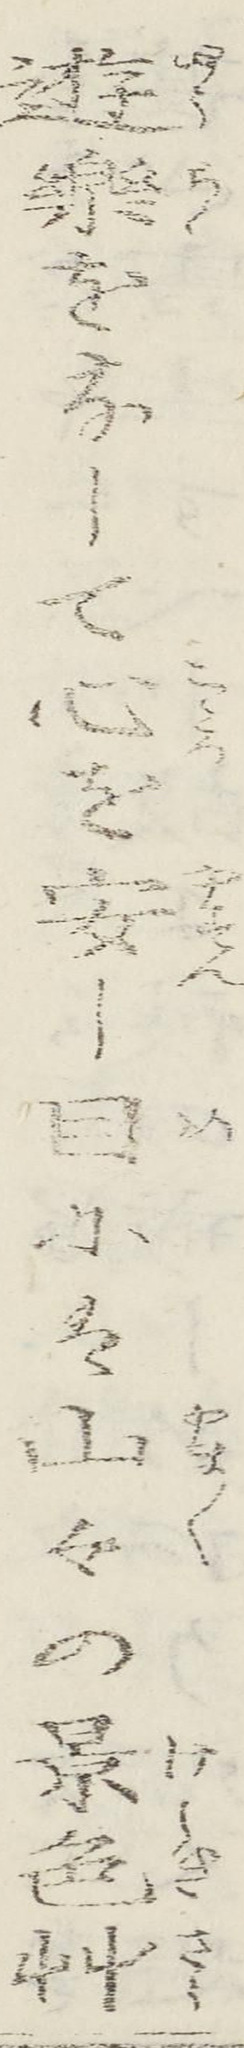遊楽をなして心を安し目には山々の景色草
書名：鎌先温泉由來記
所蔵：東京大学地震研究所図書室 Earthquake Research Institute Library, The University of Tokyo, JAPAN
